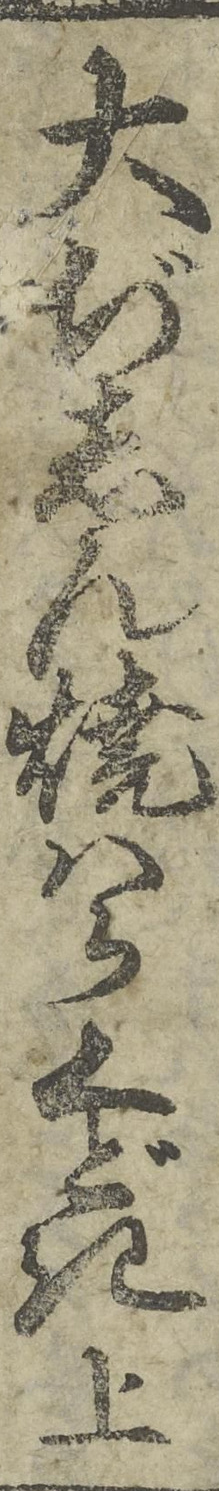大ぢしん焼はらくどき上

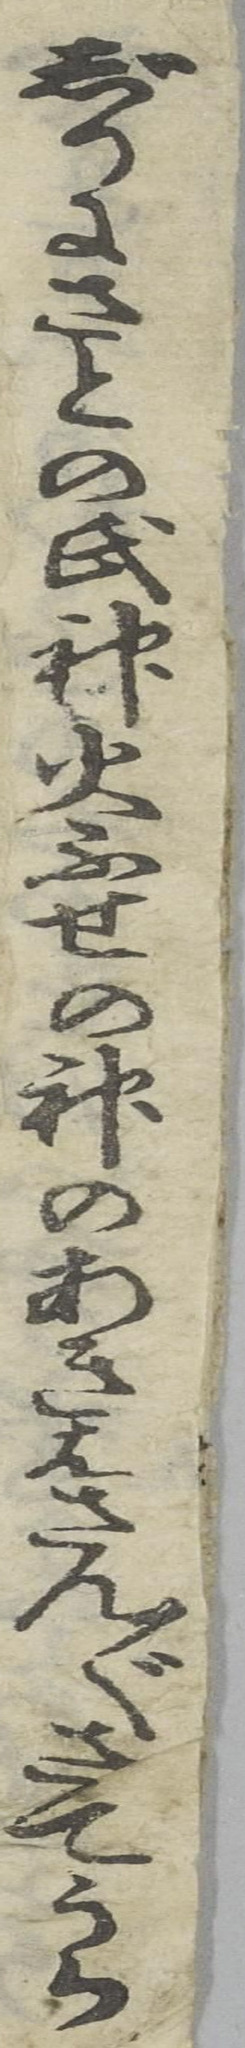じりにさとの氏神火ふせの神のあきはさん〴〵さてうら
